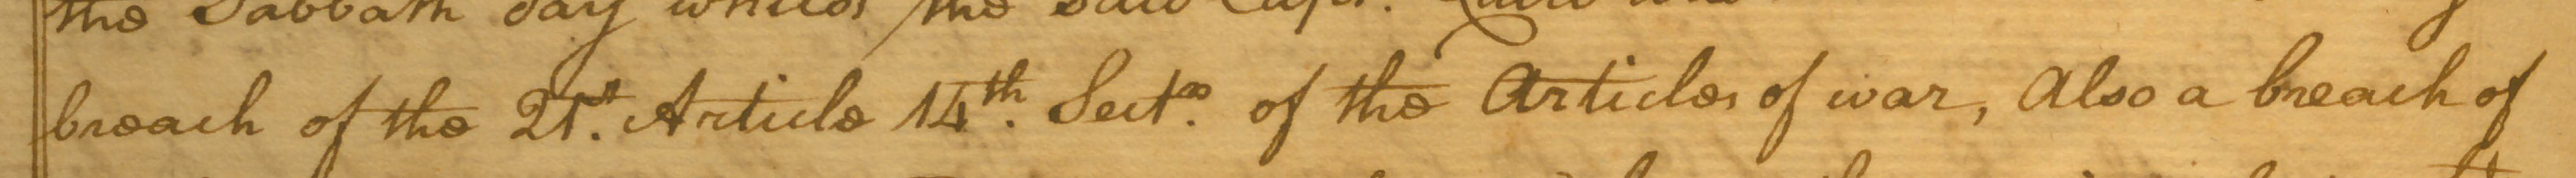breach of the 21^st. Article 14^th. Sect^n. of the Articles of war, also a breach of
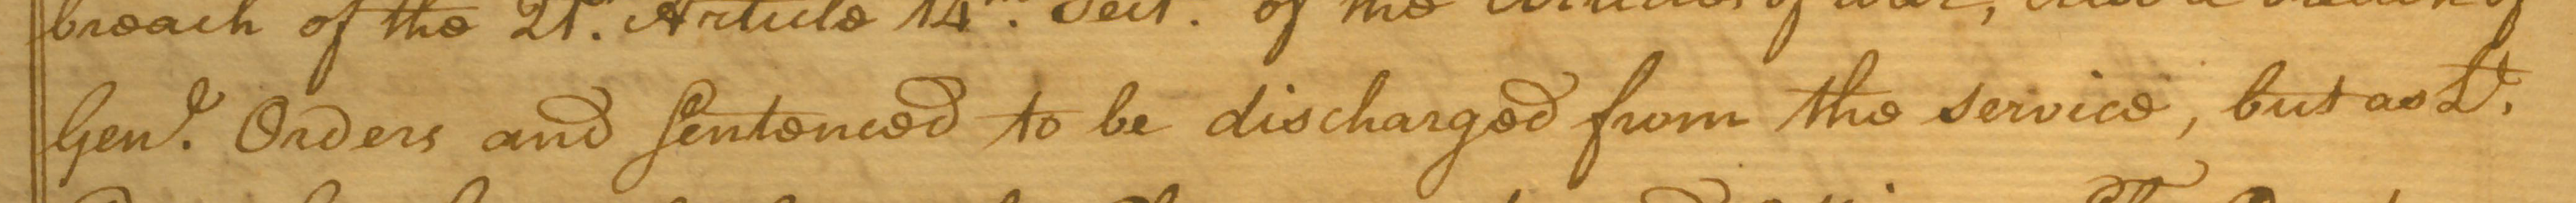Gen^l. Orders and sentenced to be discharged from the service, but as L^t.
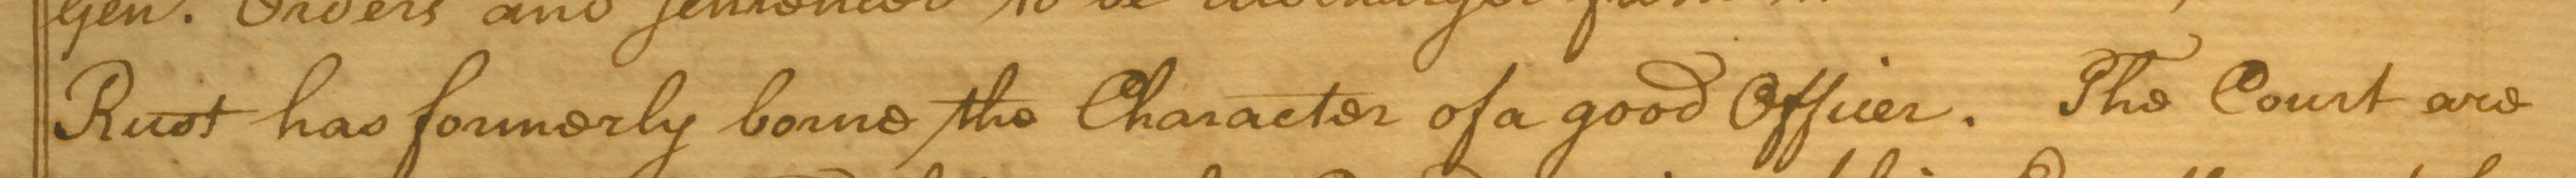Rust has formerly borne the Character of a good Officer. The Court are
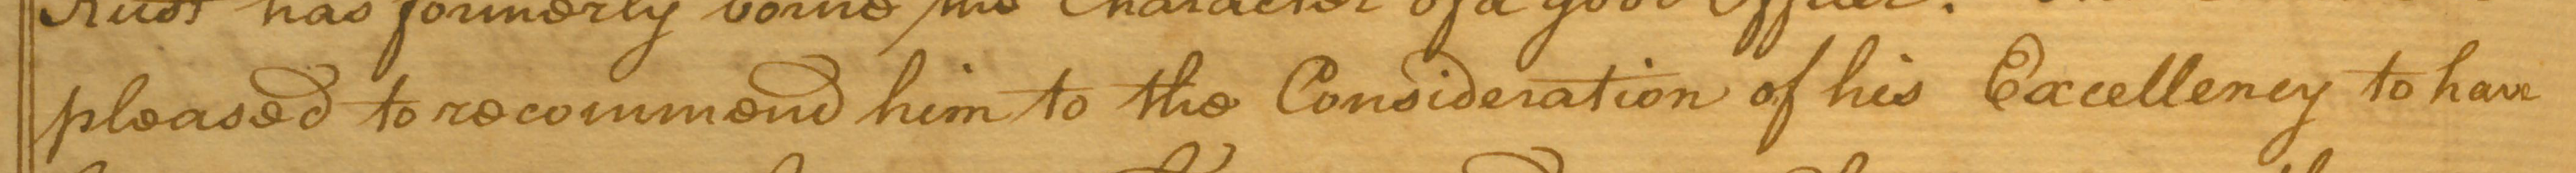pleased to recommend him to the Consideration of his Excellency to have
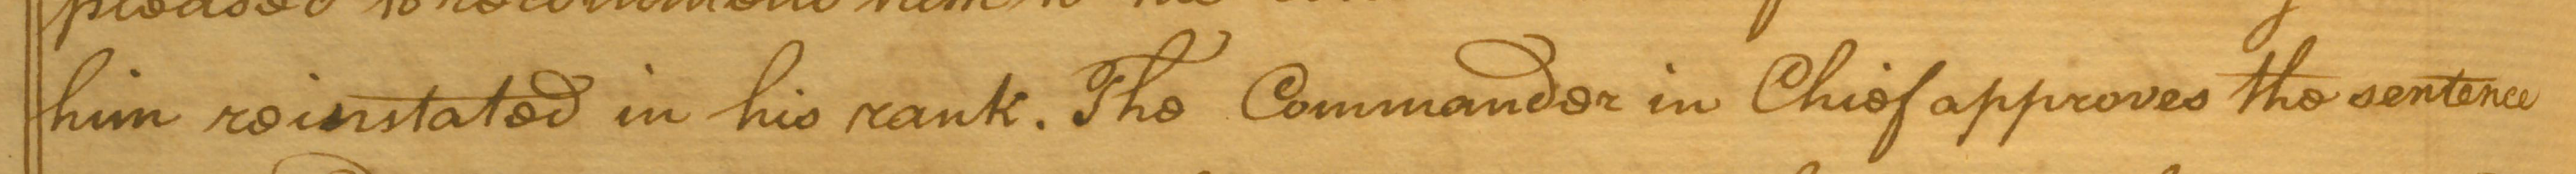him reinstated in his rank. The Commander in Chief approves the sentence
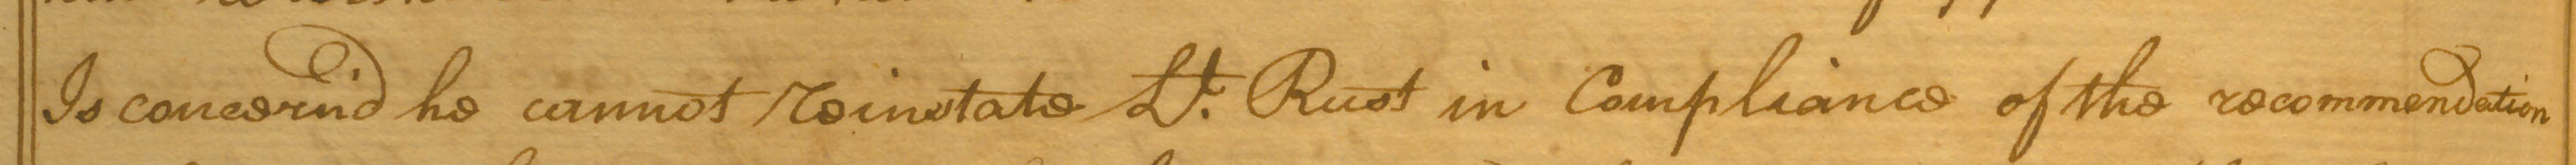Is concern'd he cannot reinstate L^t. Rust in Compliance of the recommendation
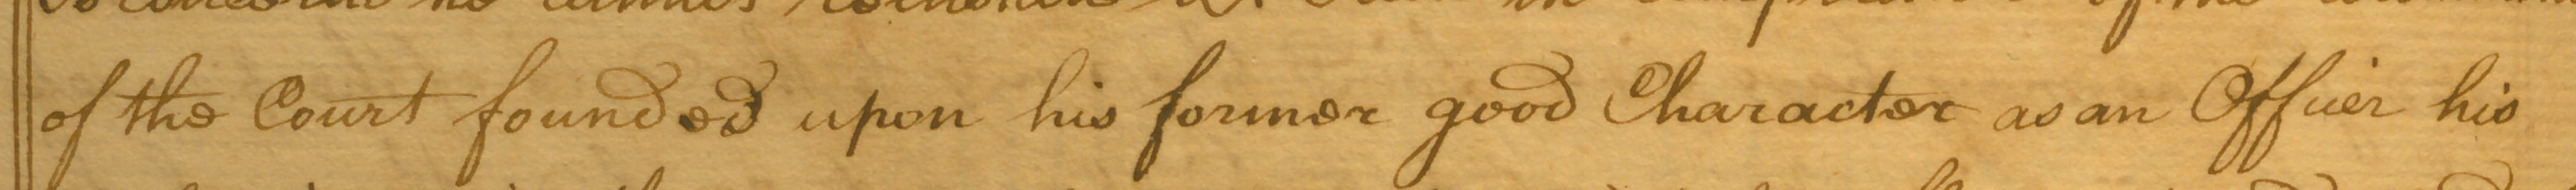of the Court founded upon his former good Character as an Officer his
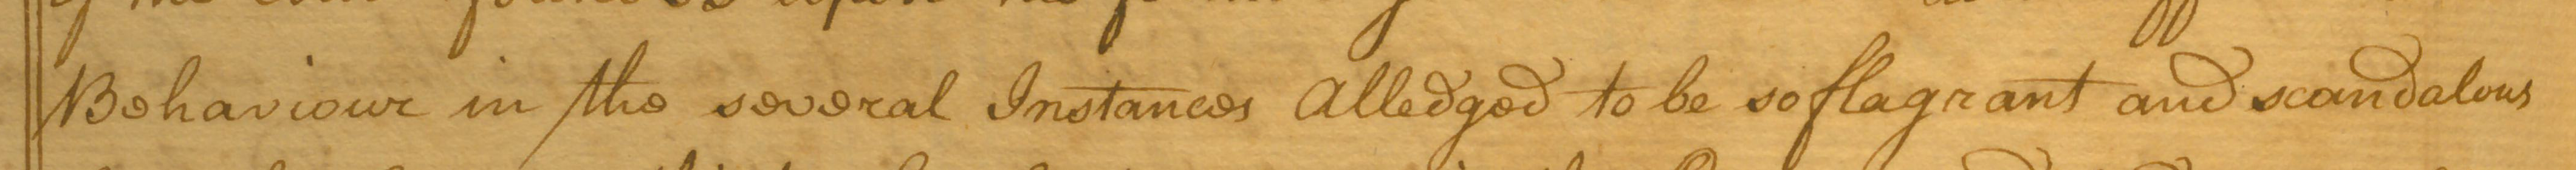Behaviour in the several Instances alledged to be so flagrant and scandalous
